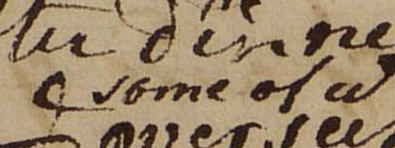some of [u^s]
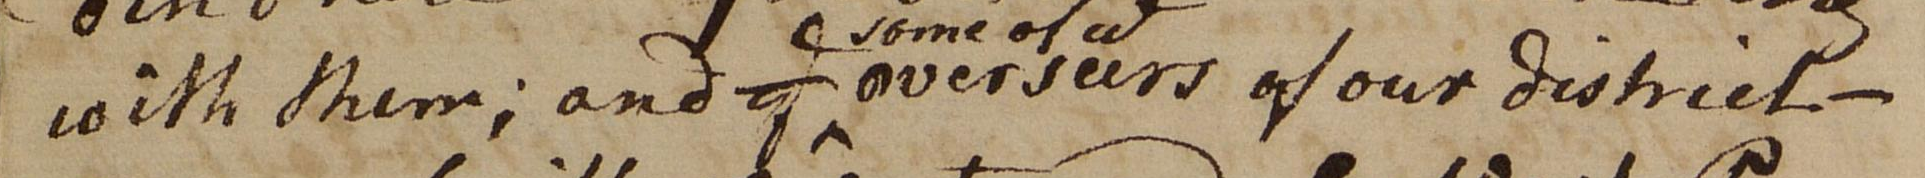with them; and y^e overseers of our district-
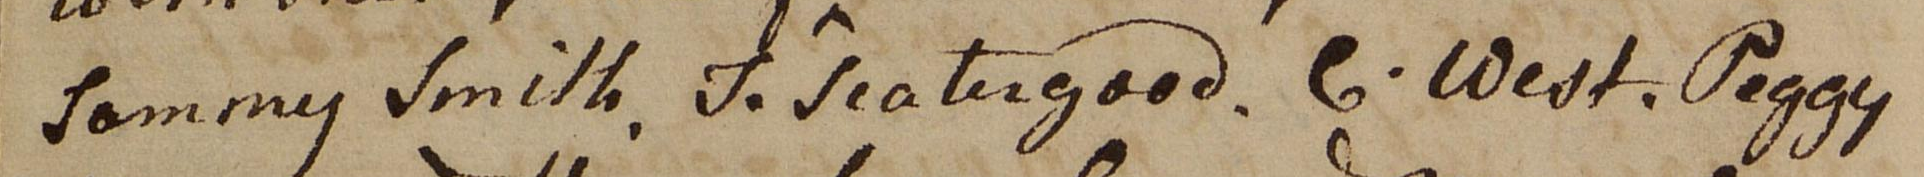Sammy Smith, T. Scatergood, C. West, Peggy
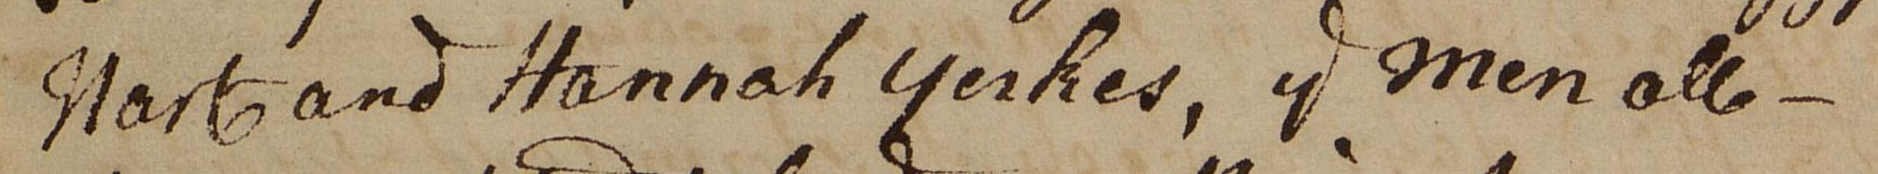Hart and Hannah Yerkes, y^e Men all-
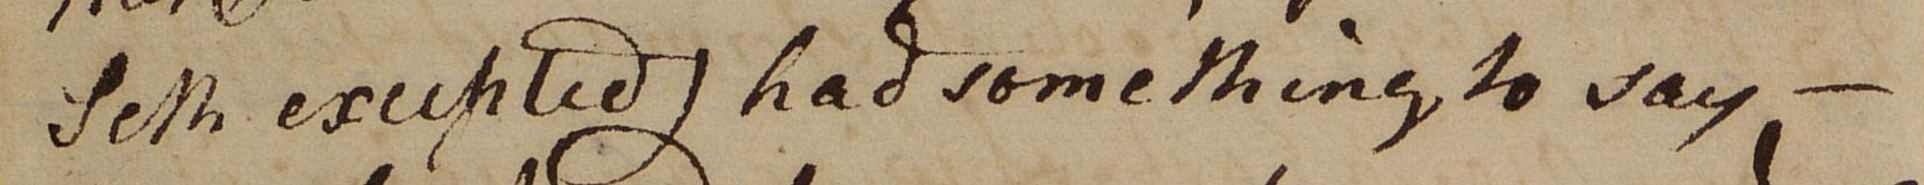Seth excepted) had something to say-
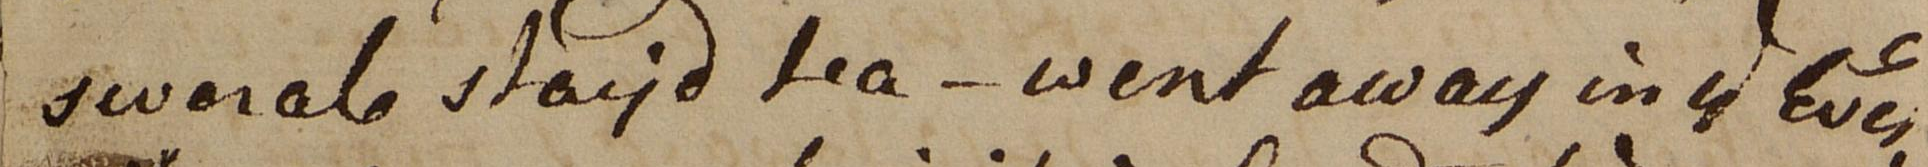several stay'd tea- went away in y^e Even.^g
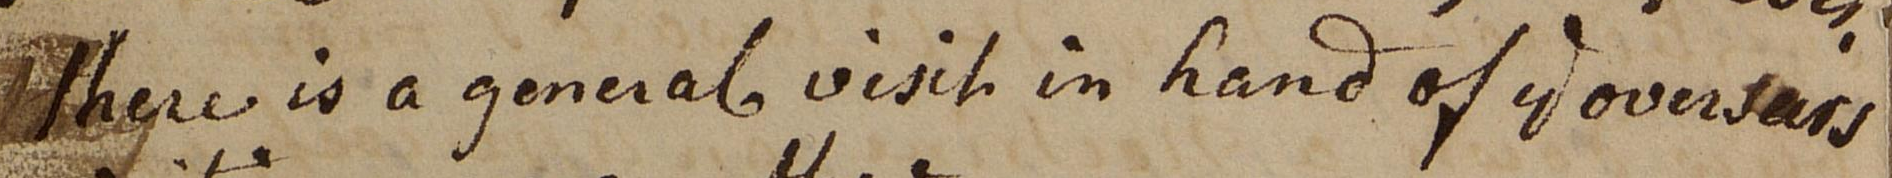there is a general visit in hand of y^e overseers
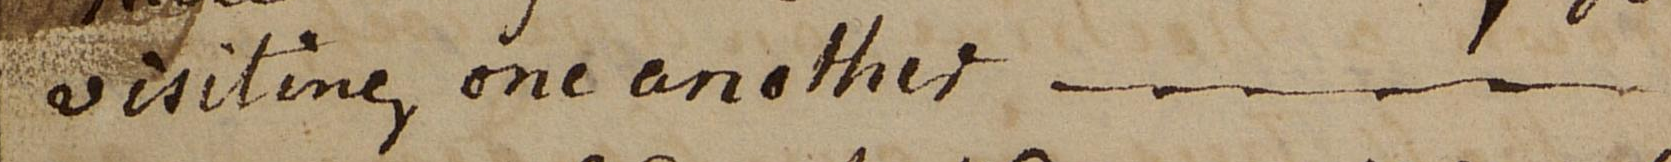visiting one another-
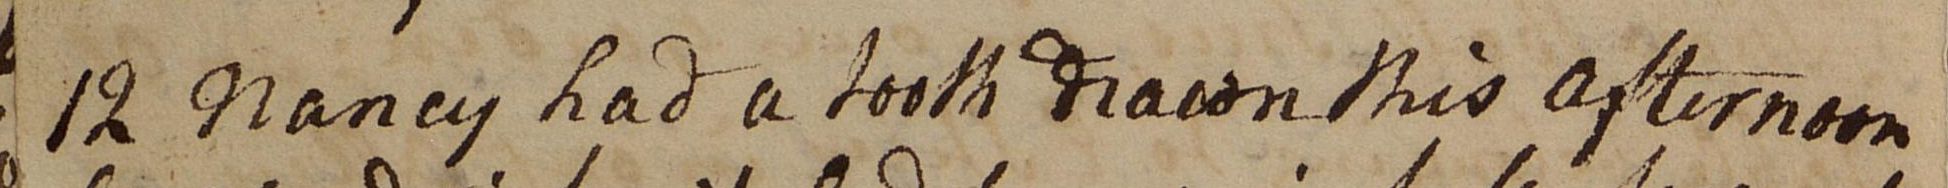12 Nancy had a tooth drawn this afternoon
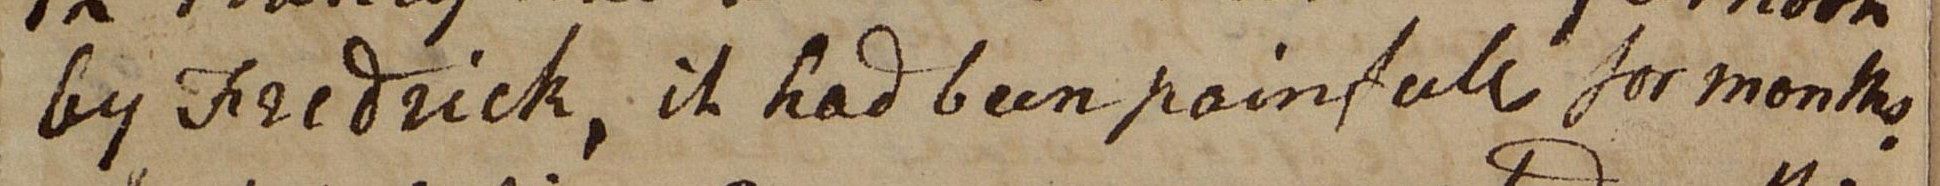by Fredrick, it had been painfull for months
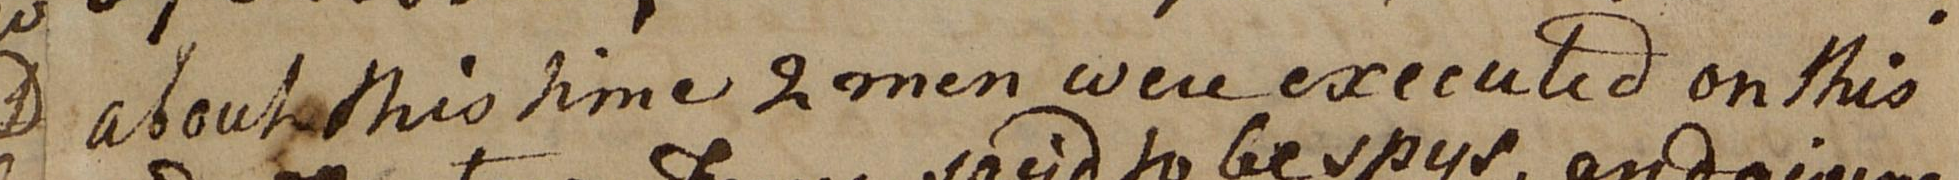about this time 2 men were executed on this
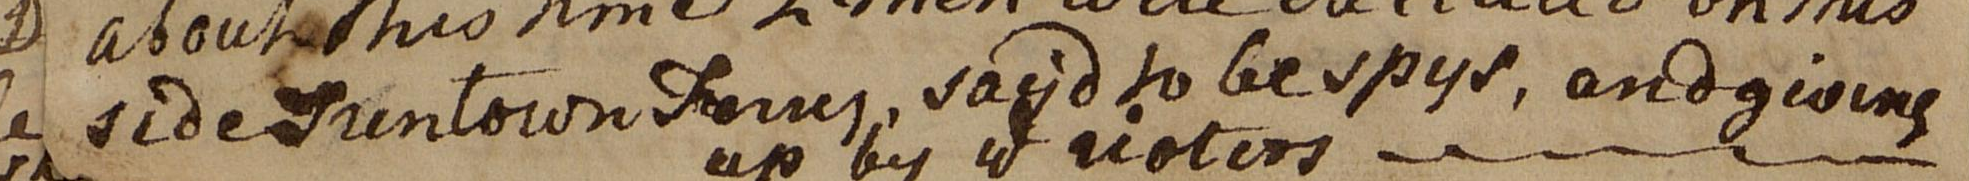side Trentown Ferry, say'd to be spys, and giving
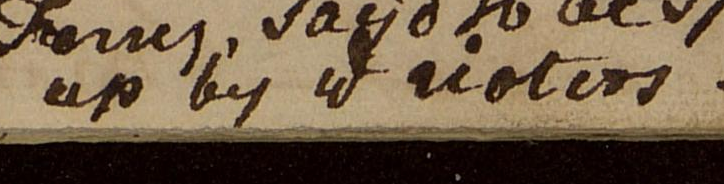up by y^e rioters-
